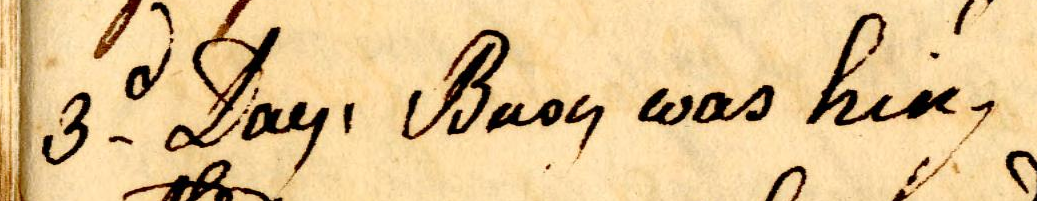3^d Day, Busy was hin
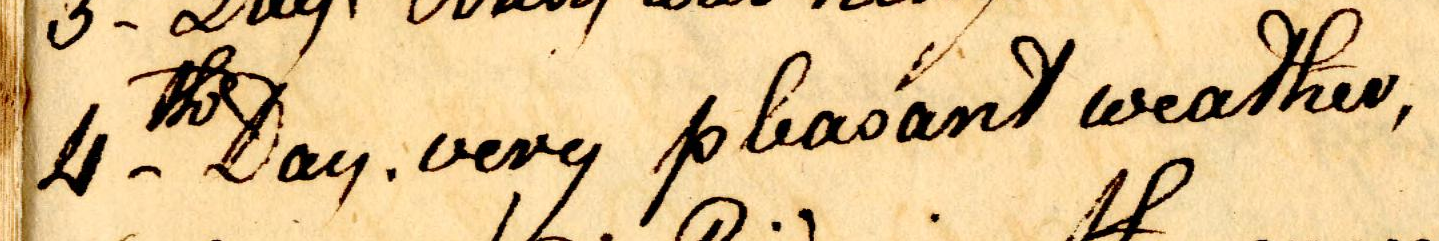4^th Day, very pleasant weather,
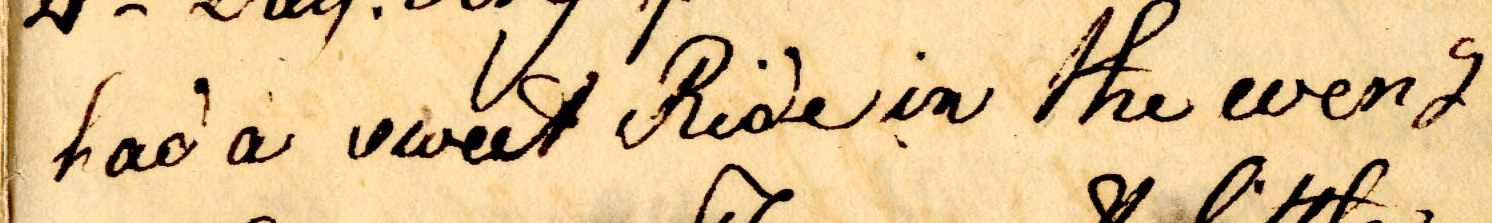had a sweet Ride in the even^g
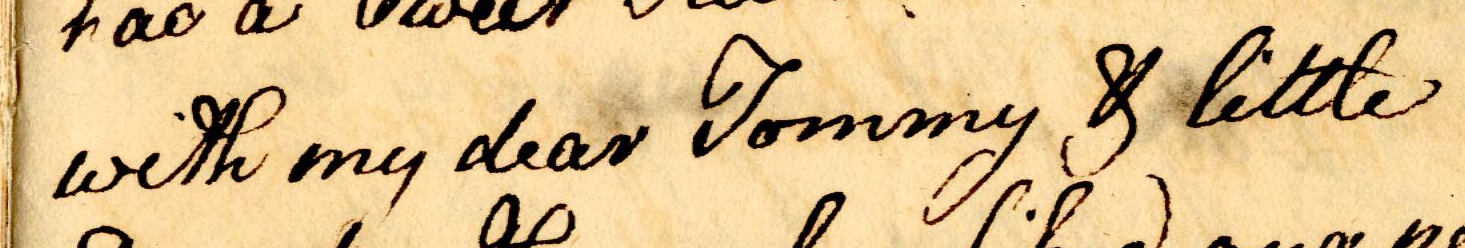with my dear Tommy & little
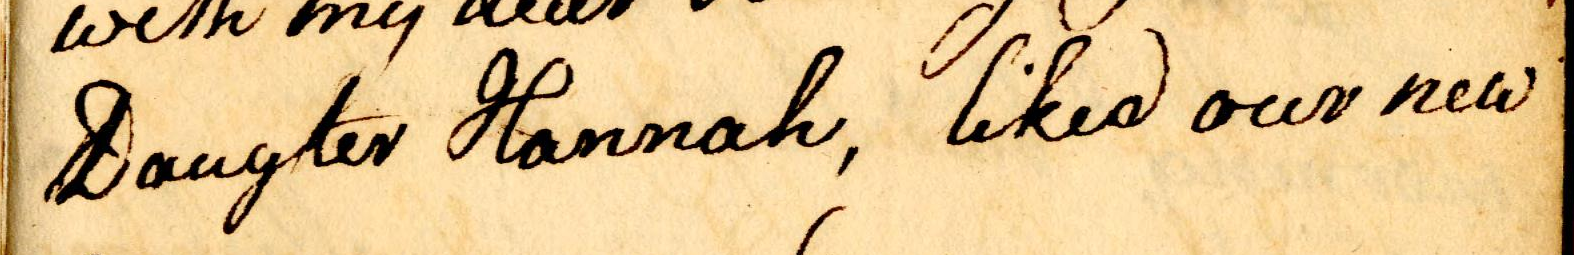Daughter Hannah, liked our new
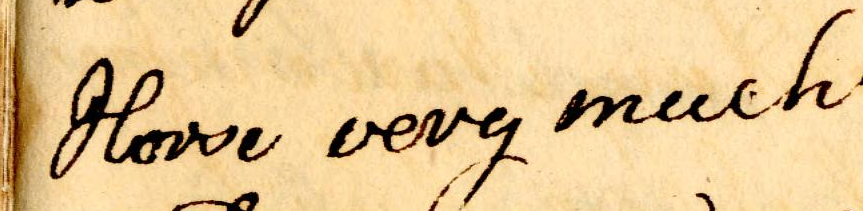Horse very much
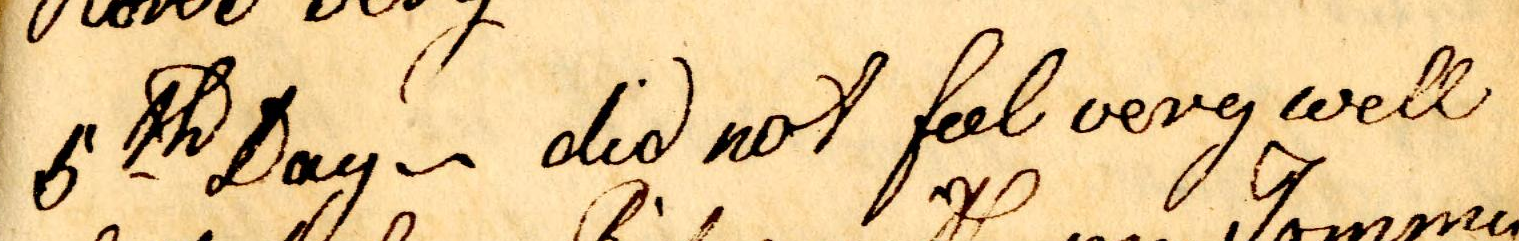5^th Day- did not feel very well
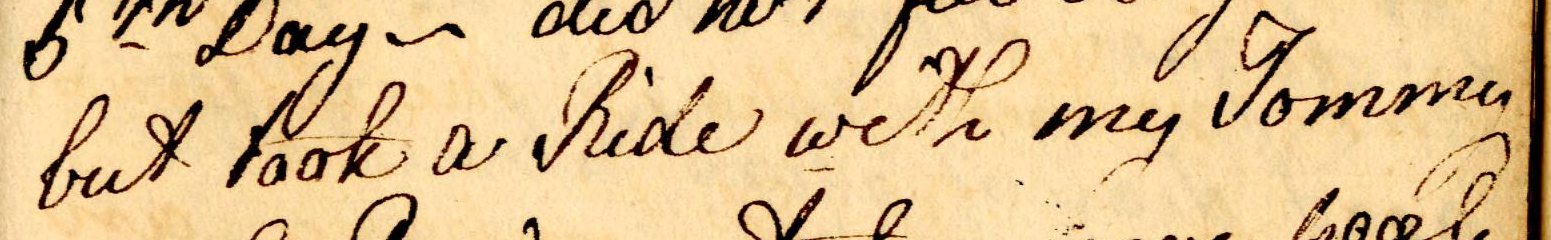but took a Ride with my Tommy
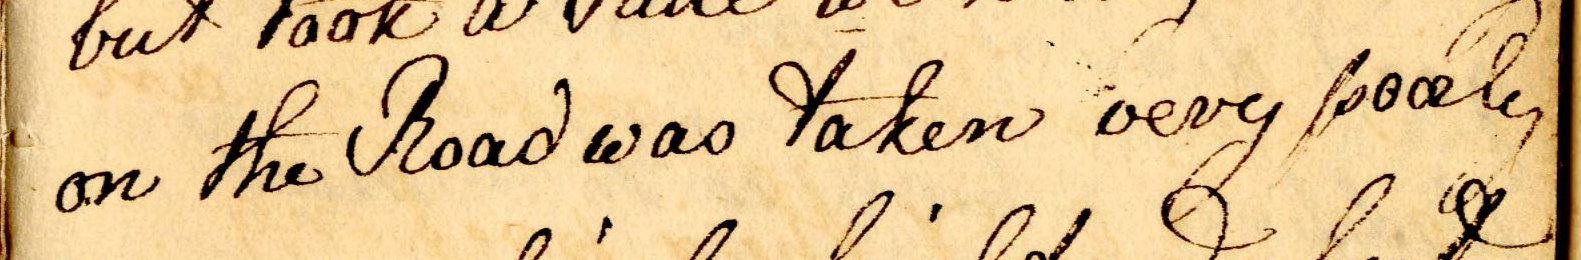on the Road was taken very poorly
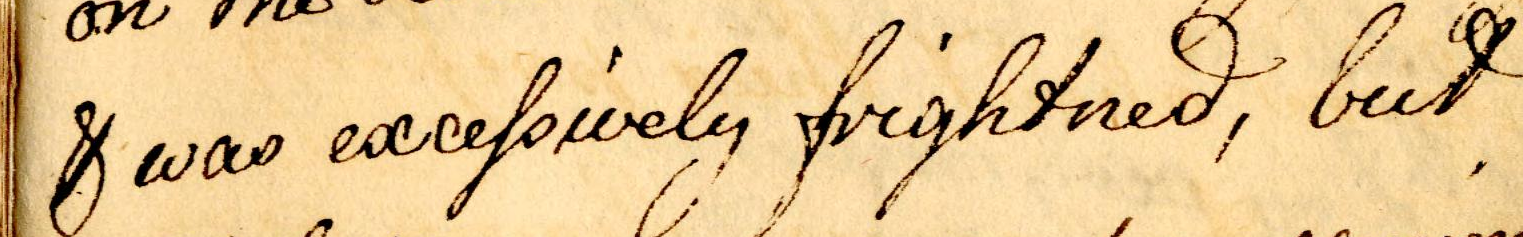& was excessively frightned, but
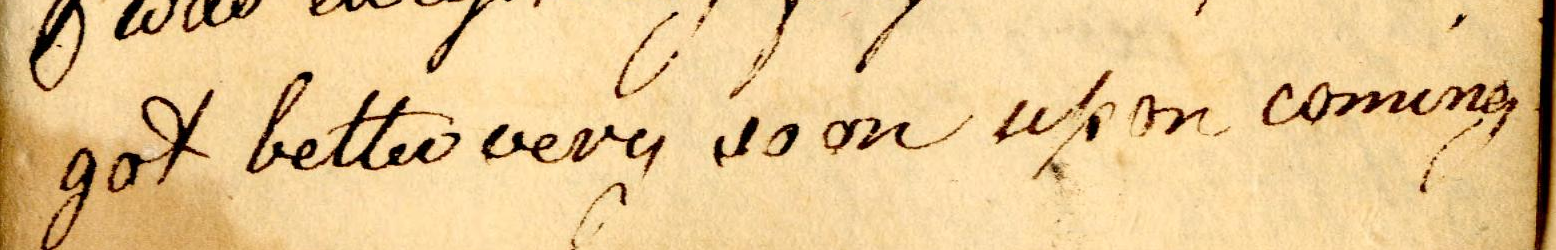got better very soon upon coming
